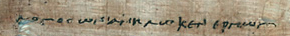λογοϲωνανηλωκεν ερμων
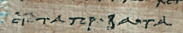ειϲταπροβατα
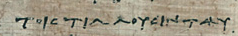τοιϲτιλλουϲινταυ
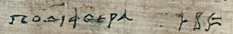ποδιφθερα Ͱβ∫≈
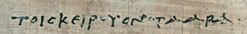τοιϲκειρουϲιντααρα
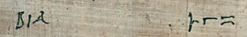βια Ͱγ≈
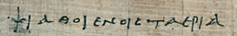ψιαθοιενοιϲταερια
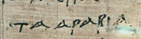τααραβια
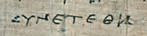ϲυνετεθη
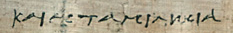καιειϲταμιληϲια
